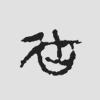居
